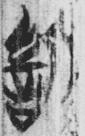○（神）
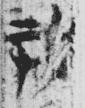戎（農）
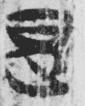是（氏）
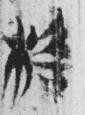椲
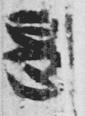是（氏）
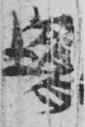○（壚）
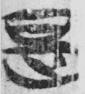是（氏）
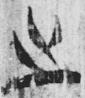之
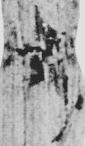又（有）
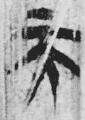天
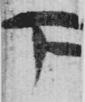下
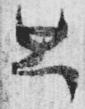也
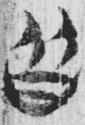皆
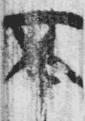不
